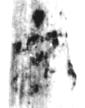不
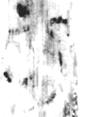可
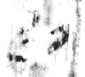㠯
